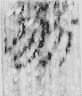所
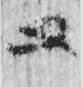又（有）
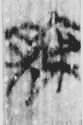責
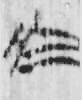於
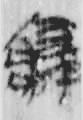寢
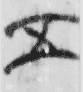五
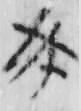帀（師）
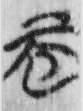而
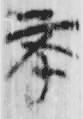不
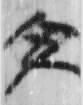交
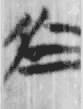於
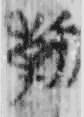新
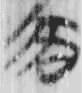客
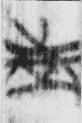者
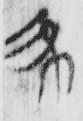豕
